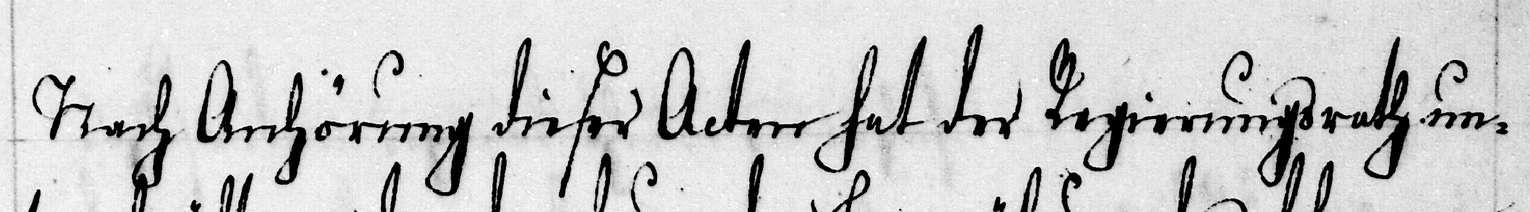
Nach Anhörung dieser Acten hat der Regierungsrath un¬
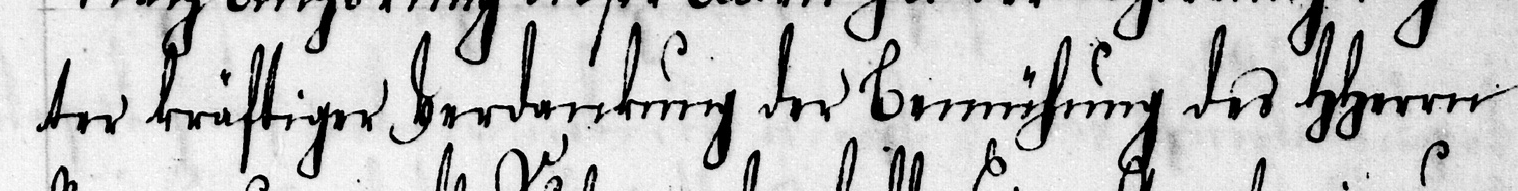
ter kräftiger Verdankung der Bemühung des HHerrn
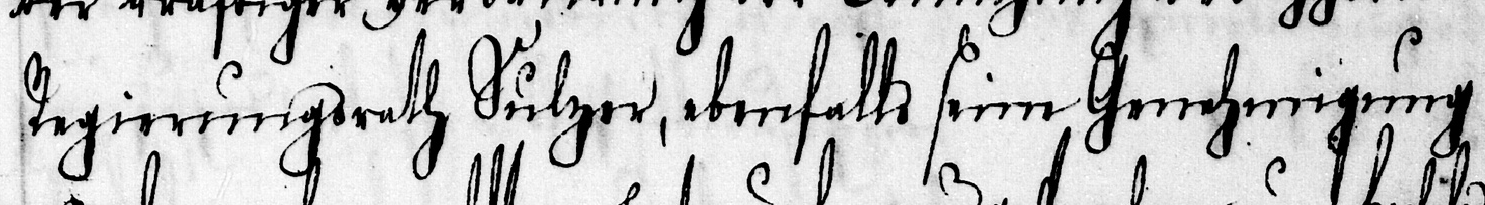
Regierungsrath Sulzer, ebenfalls seine Genehmigung
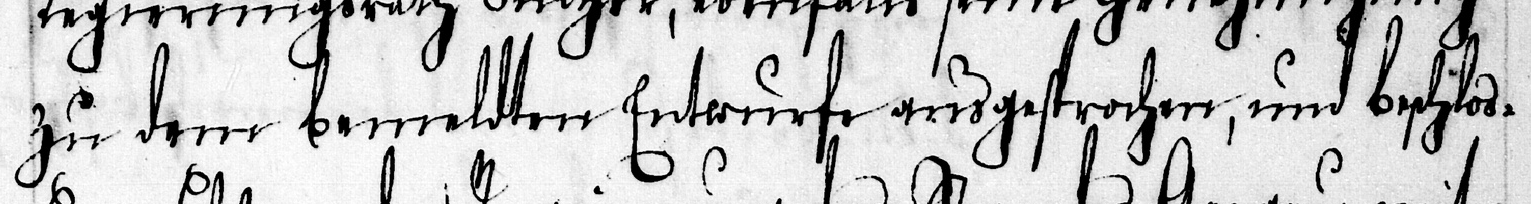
zu dem bemeldten Entwurfe ausgesprochen, und beschlo¬
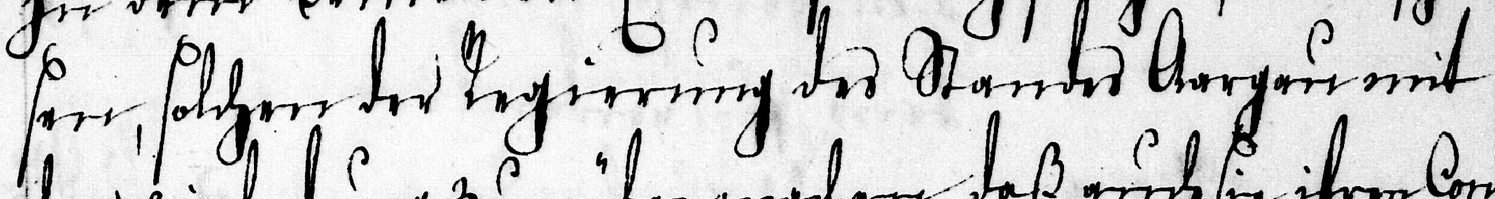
ßen, solchen der Regierung des Standes Aargau mit
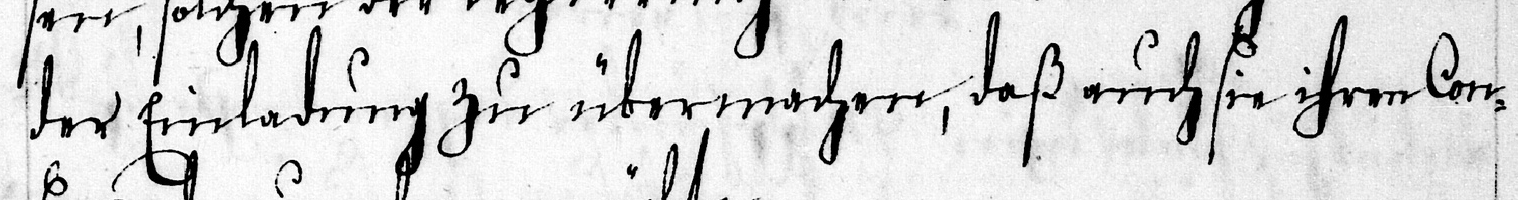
der Einladung zu übermachen, daß auch sie ihren Con¬
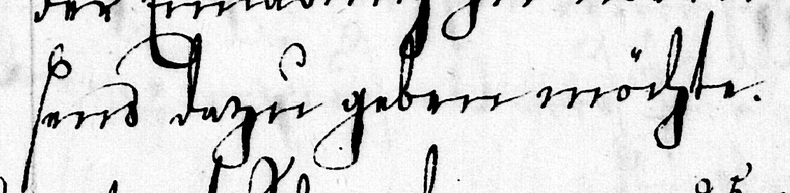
sens dazu geben möchte.
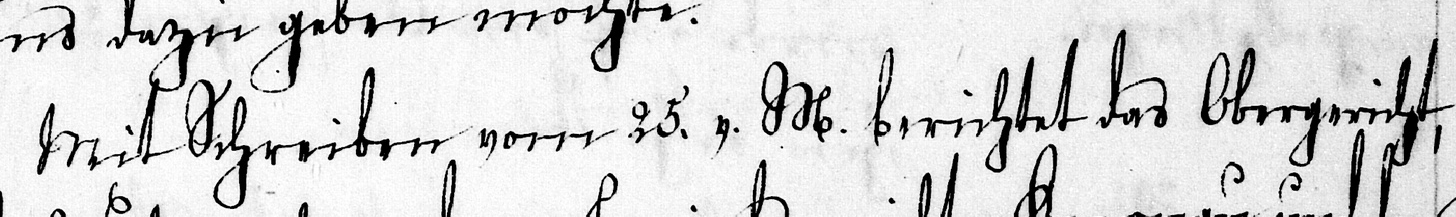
Mit Schreiben vom 25. v. M. berichtet das Obergericht,
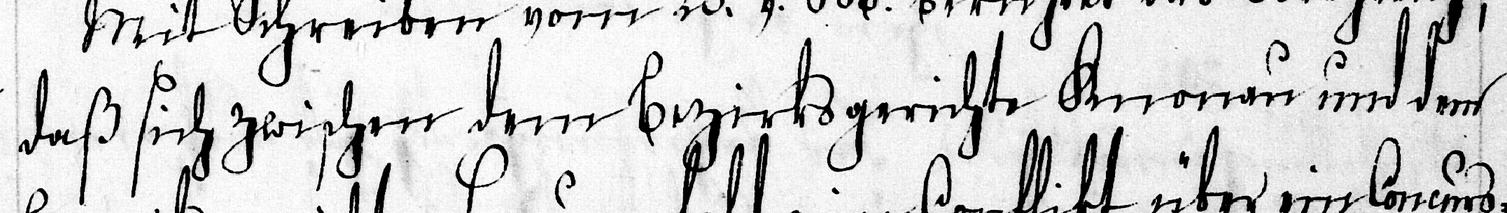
daß sich zwischen dem Bezirksgerichte Knonau und dem
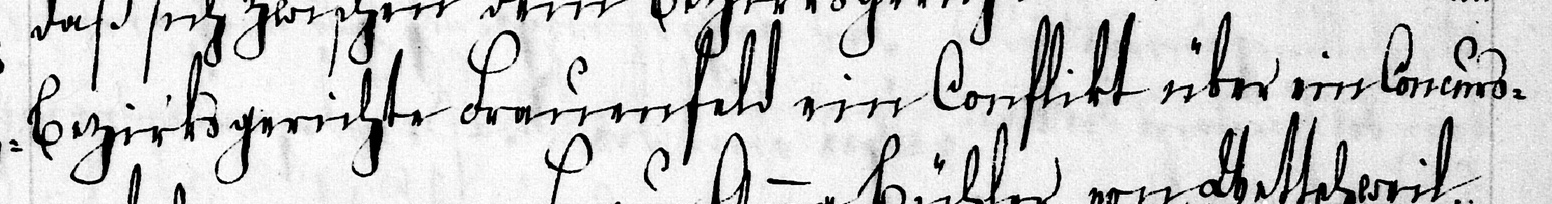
Bezirksgerichte Frauenfeld ein Conflict über ein Concurs¬
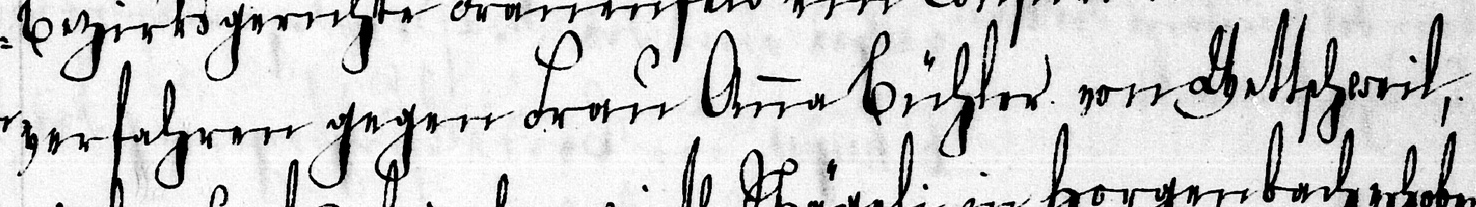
verfahren gegen Frau Anna Bühler von Wettschweil,
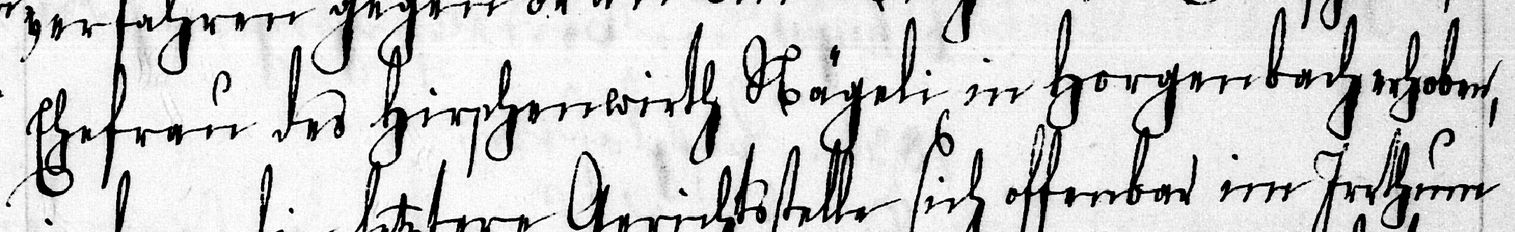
Ehefrau des Hirschenwirth Nägeli in Horgenbach erhobe¬
